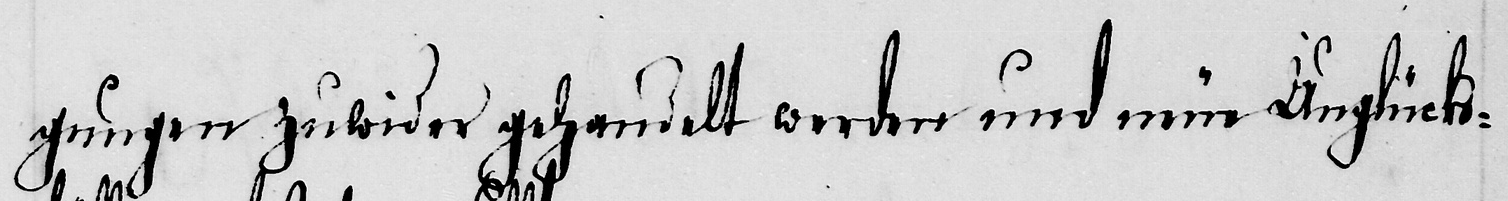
gungen zuwider gehandelt werden und neue Unglücks¬
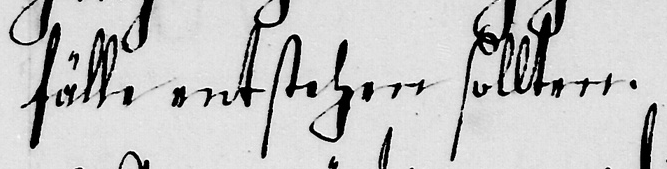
fälle entstehen sollten.
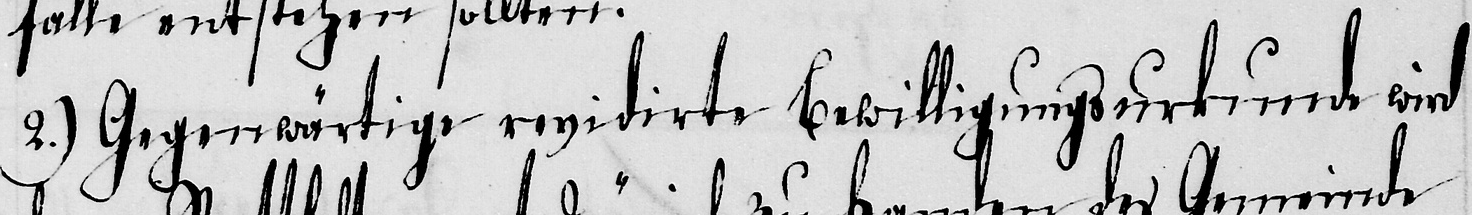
2.) Gegenwärtige revidirte Bewilligungsurkunde wird
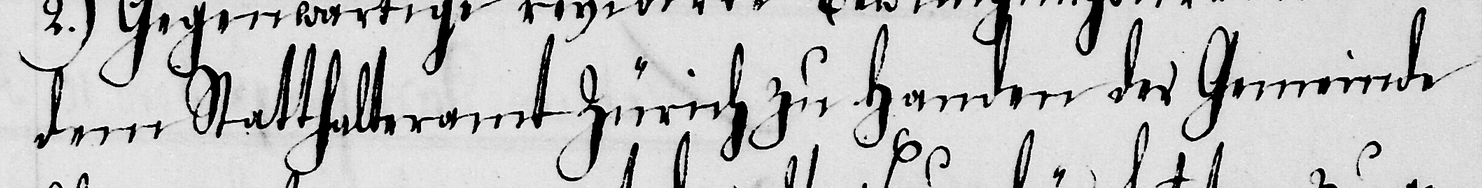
dem Statthalteramt Zürich zu Handen der Gemeinde
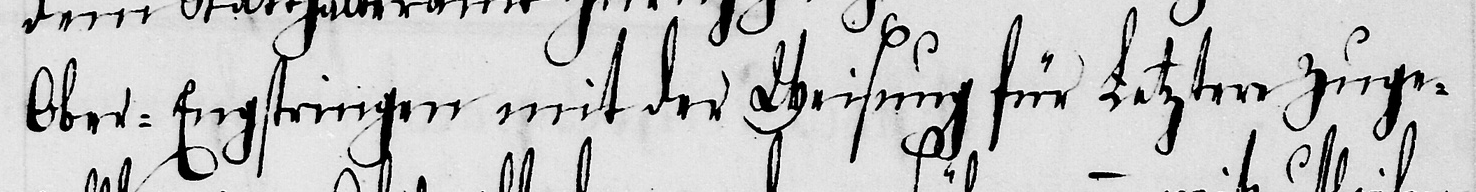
Ober-Engstringen mit der Weisung für Letztere zuges¬
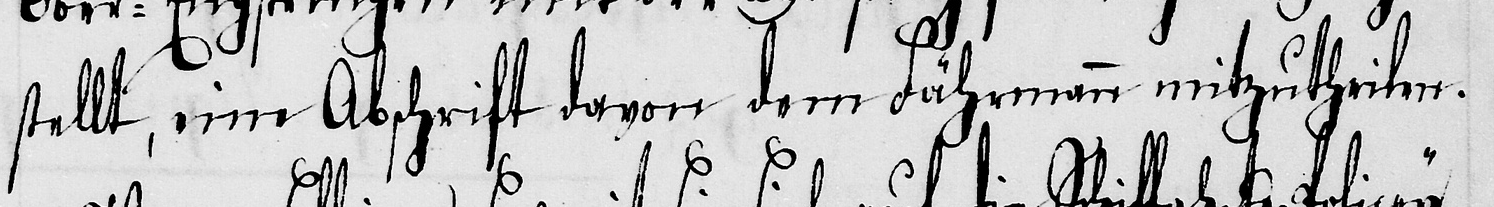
tellt, eine Abschrift davon dem Fährmann mitzutheilen.
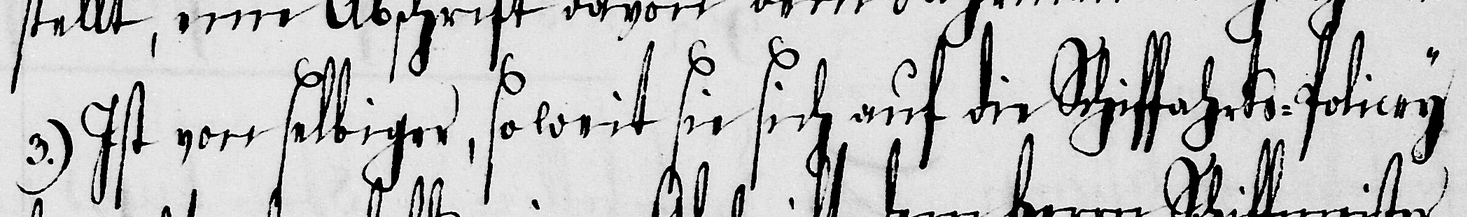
3.) Ist von selbiger, soweit sie sich auf die
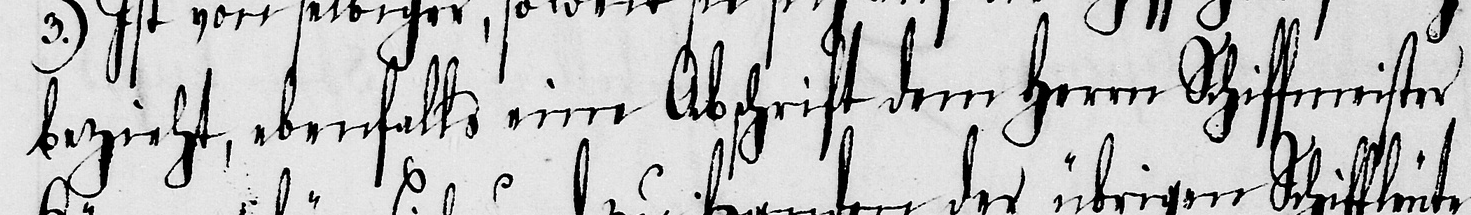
bezieht, ebenfalls eine Abschrift dem Herrn Schiffmeis¬
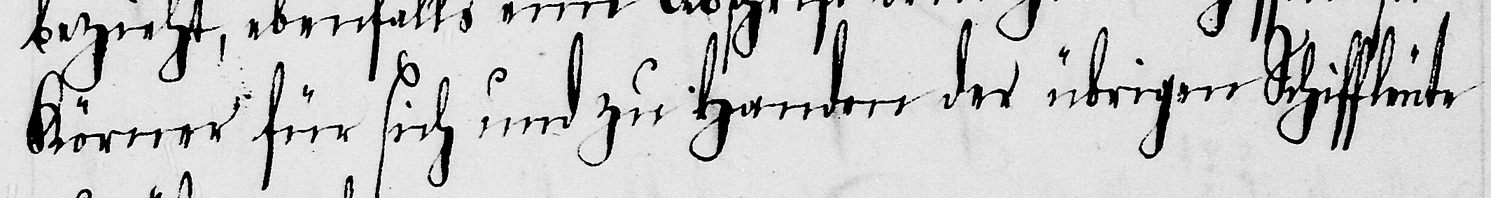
Körner für sich und zu Handen der übrigen Schiffleute
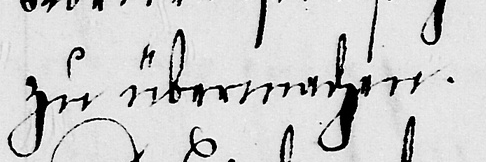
zu übermachen.
